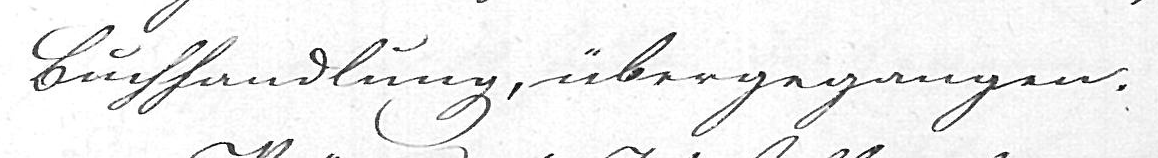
Buchhandlung, übergegangen.
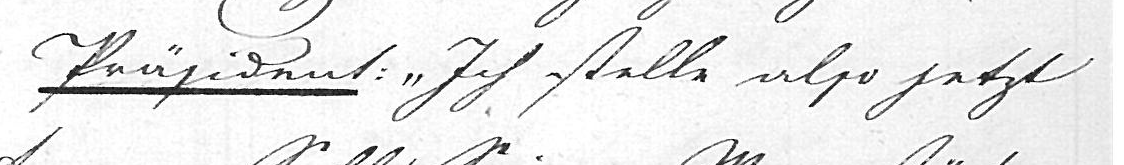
Präsident: "Ich stelle also jetzt
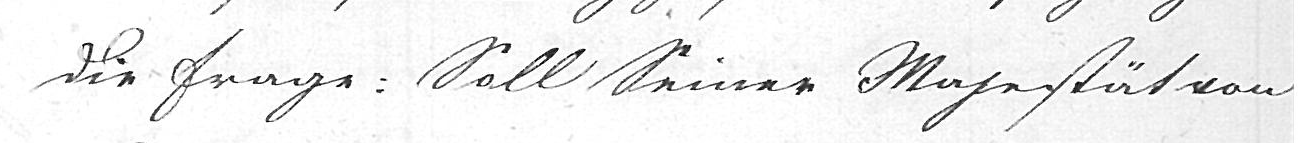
die Frage: Soll Seiner Majestät von
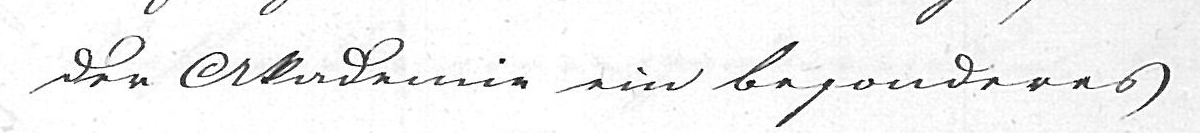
der Akademie ein besonderes
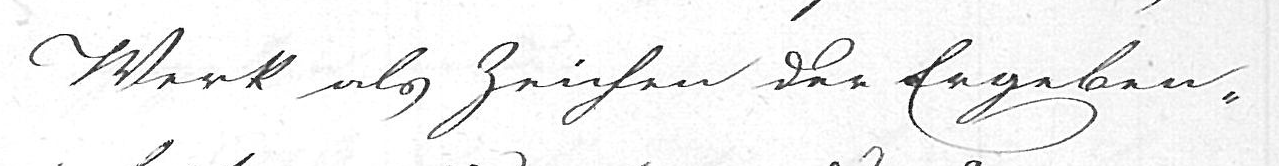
Werk als Zeichen der Ergeben-
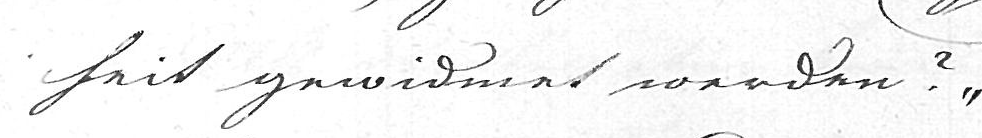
heit gewidmet werden?"
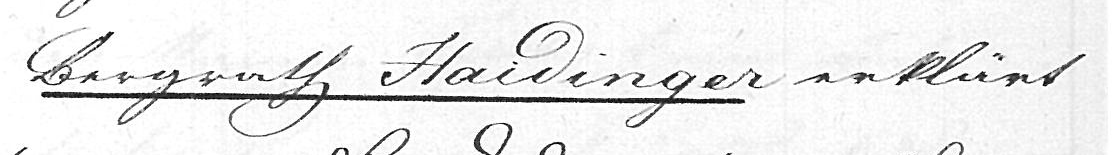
Bergrath Haidinger erklärt
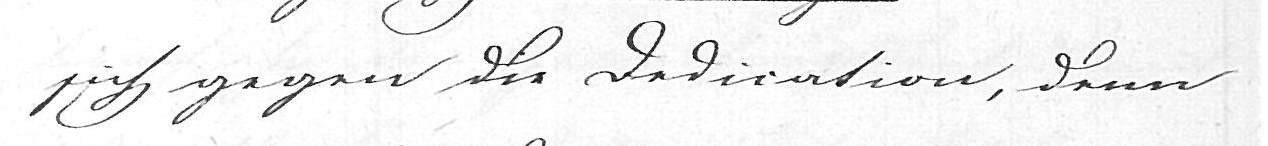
sich gegen die Dedication, denn
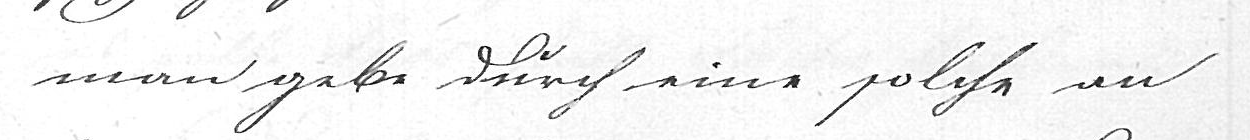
man gebe durch eine solche an
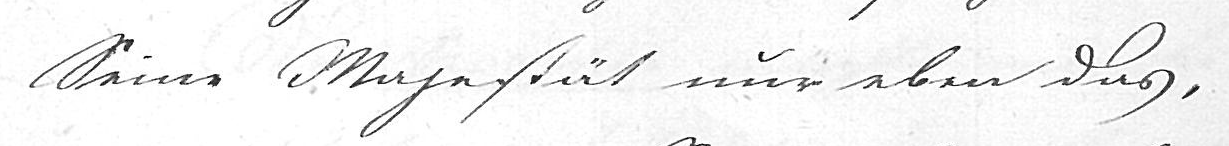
Seine Majestät nur eben das,
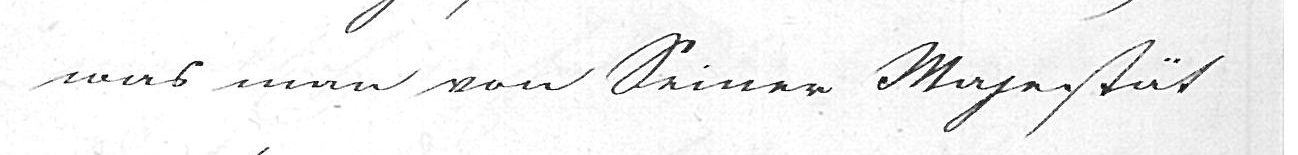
was man von Seiner Majestät
